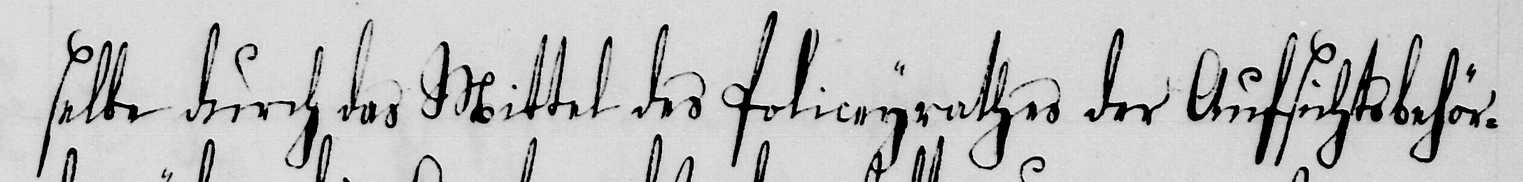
selbe durch das Mittel des Policeyrathes der Aufsichtsbehö¬
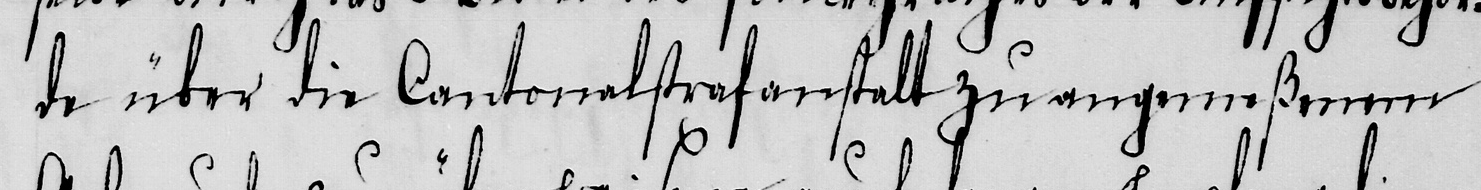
rde über die Cantonalstrafanstalt zu angemeßenem
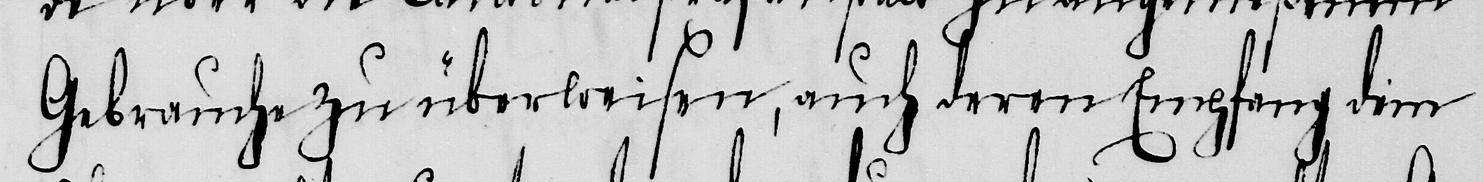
Gebrauche zu überweisen, auch deren Empfang dem
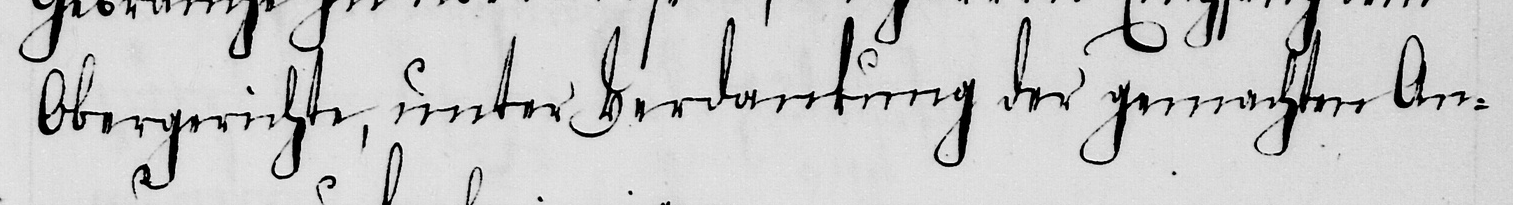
Obergerichte, unter Verdankung der gemachten An¬
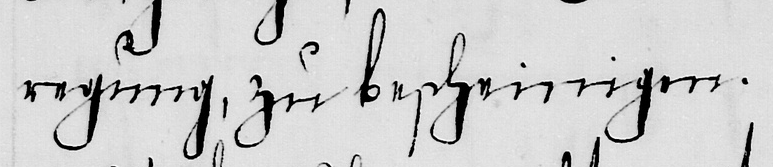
regung, zu bescheinigen.
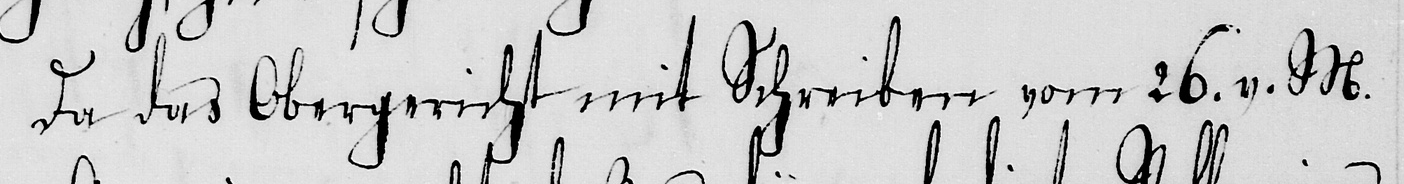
Da das Obergericht mit Schreiben vom 26. v. M.
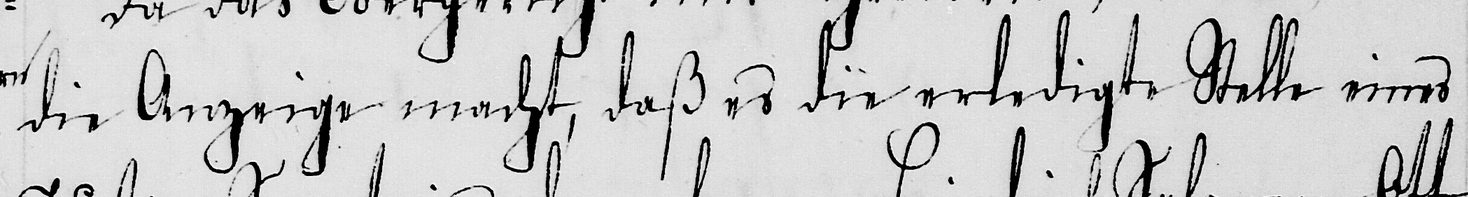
die Anzeige macht, daß es die erledigte Stelle eines
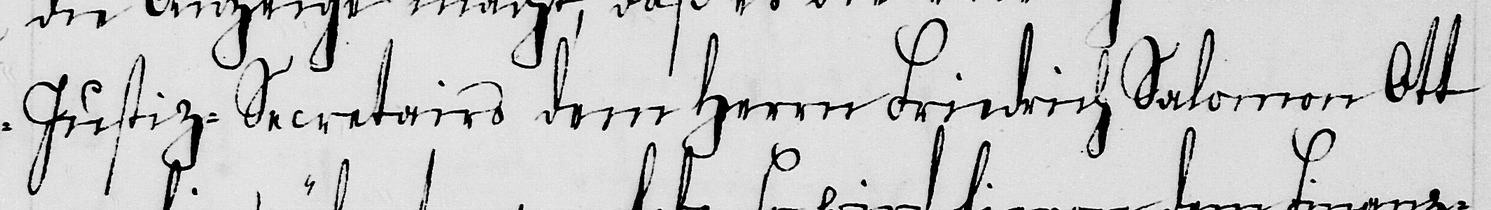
Justiz-Secretairs dem Herrn Friedrich Salomon Ott
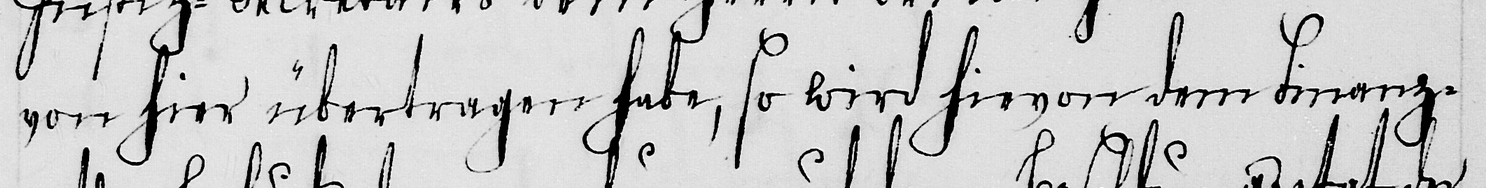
von hier übertragen habe, so wird hievon dem Finanz¬
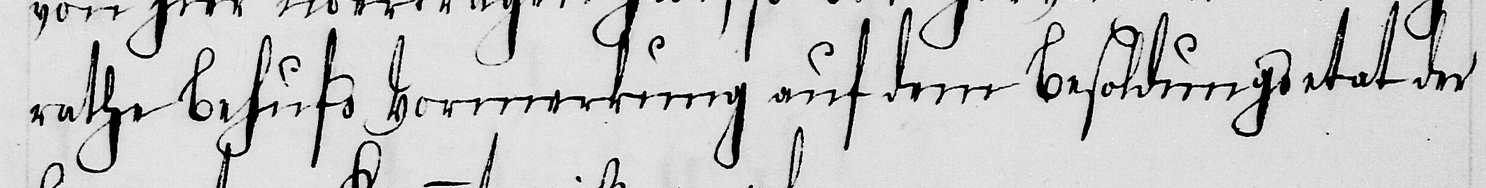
rathe Behufs Vormerkung auf dem Besoldungsetat der
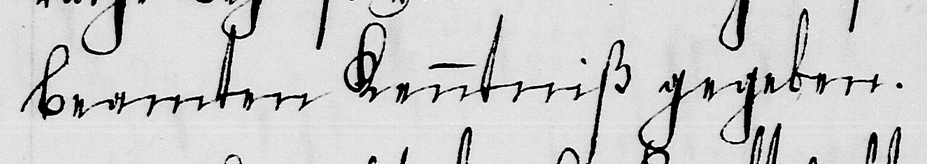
Beamten Kenntniß gegeben.
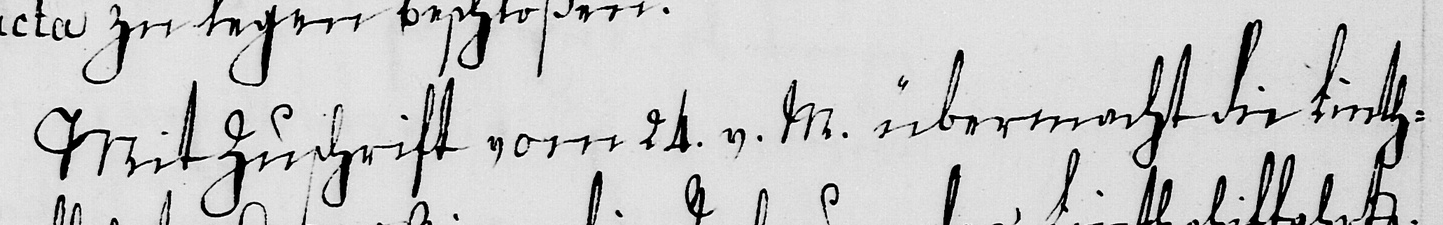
Mit Zuschrift vom 24. v. M. übermacht die Linth¬
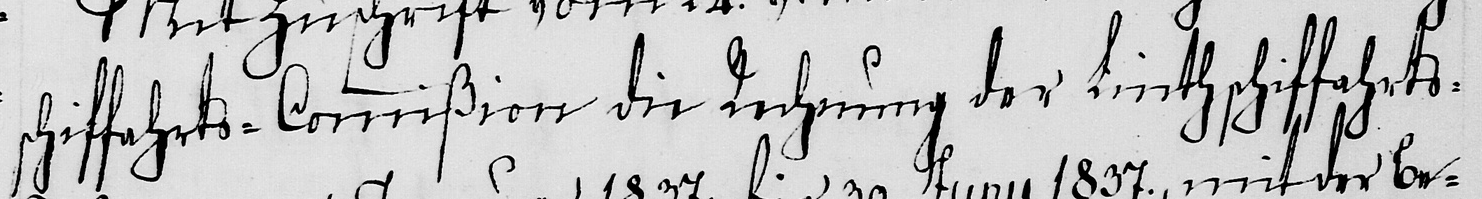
hiffahrts-Commißion die Rechnung der Linthschiffahrt¬
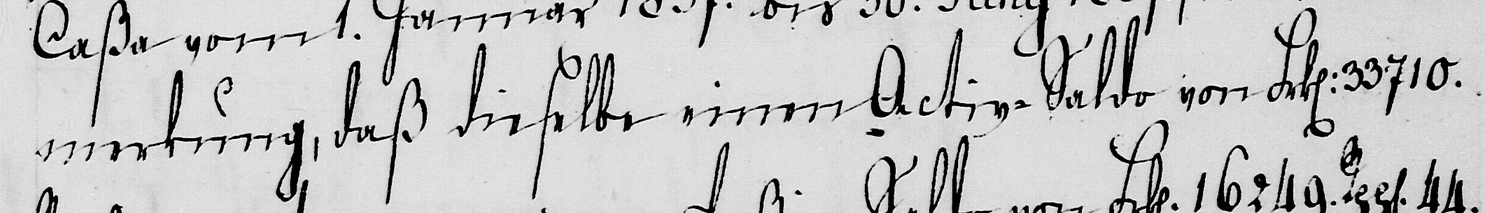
merkung, daß dieselbe einen Activ-Saldo von Frk[en].
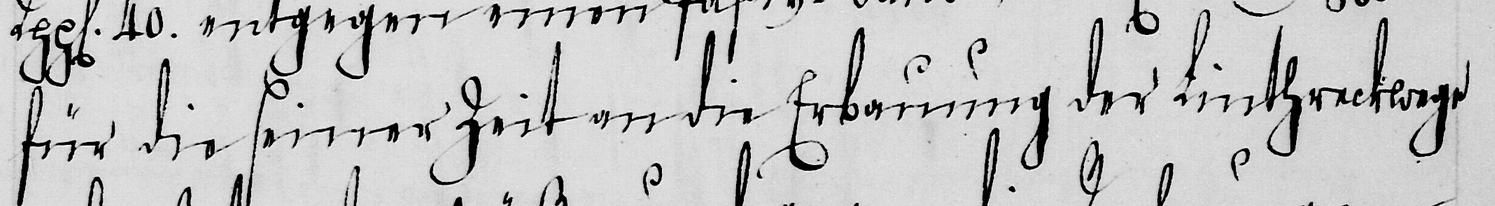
für die seiner Zeit an die Erbauung der Linthreckwege
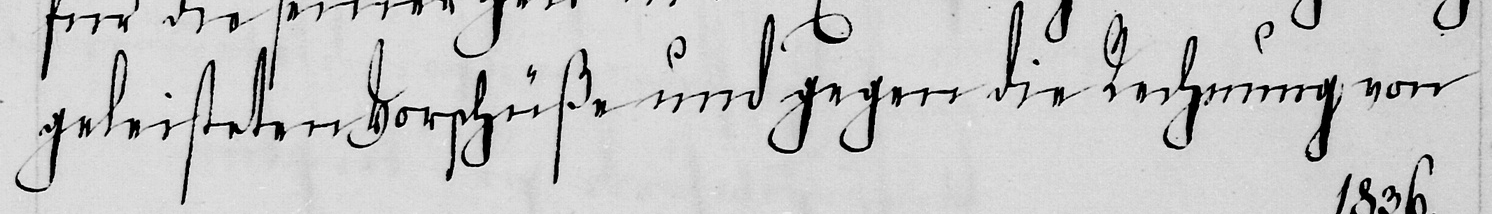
geleisteten Vorschüße und gegen die Rechnung von
